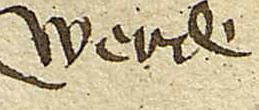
werde
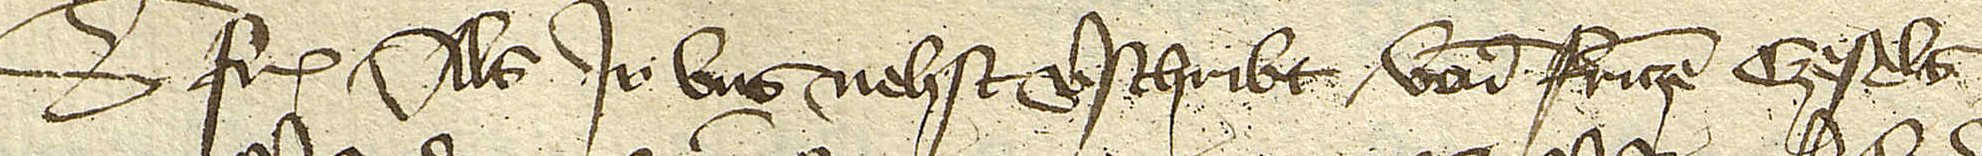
L* fr* / Als Ir vns nehſt v*ſchribt / von* fricʒe* Cʒeſels
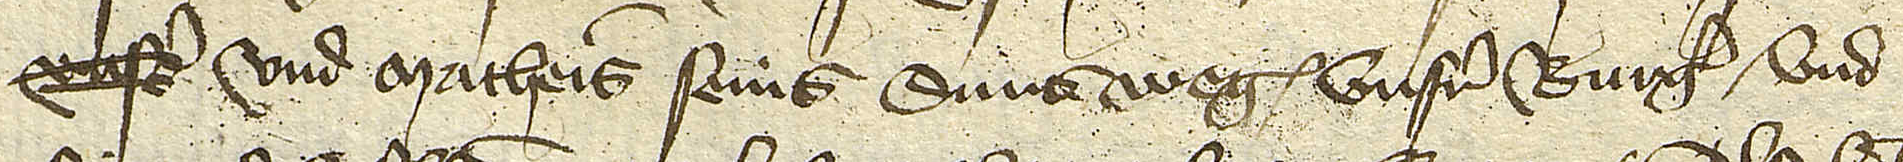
vnſs* vnd Matheis ſeins Suns weg* vnſr* Burg* / vnd
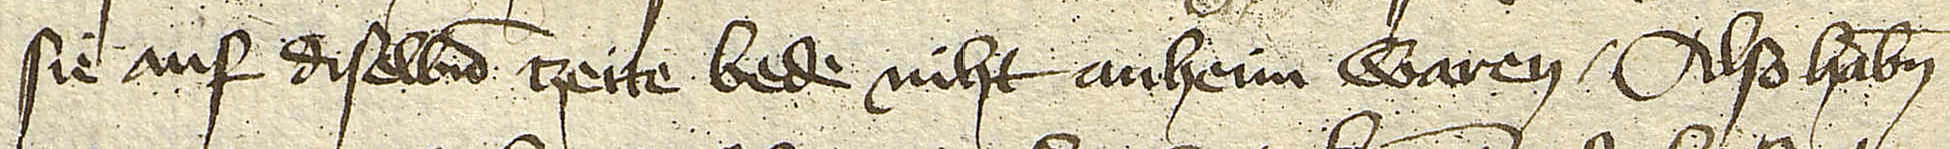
ſie auf diſelbn* cʒeite bede niht anheim waren / Alſo habn*
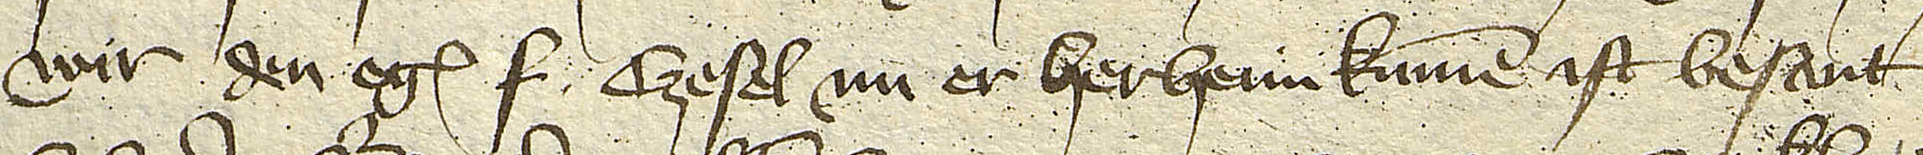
wir den eg* f . Cʒeſel nu er herheim kume* iſt beſant
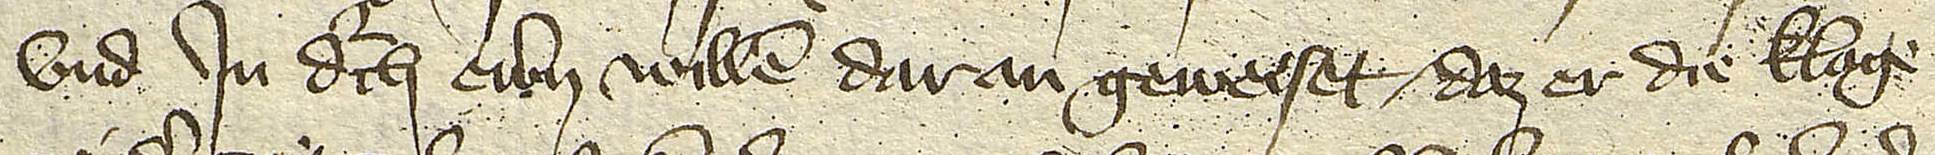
vnd In d*ch ew*n wille* daran geweiſet / daʒ er die klage
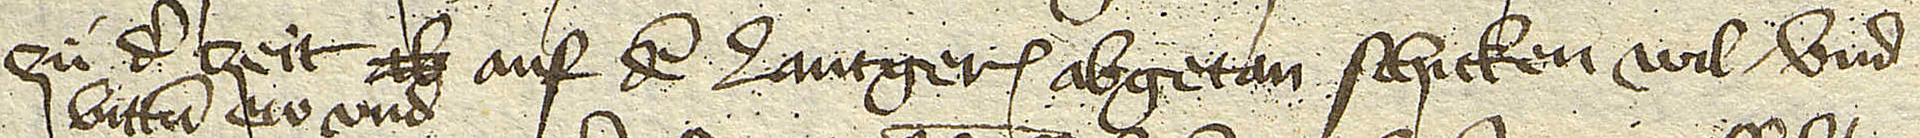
cʒü d* cʒeit ab* auf d* Lantger* abgetan ſchicken wil / vnd
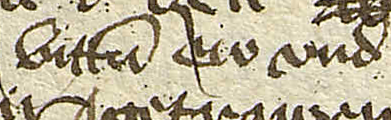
bittn* ew vnd
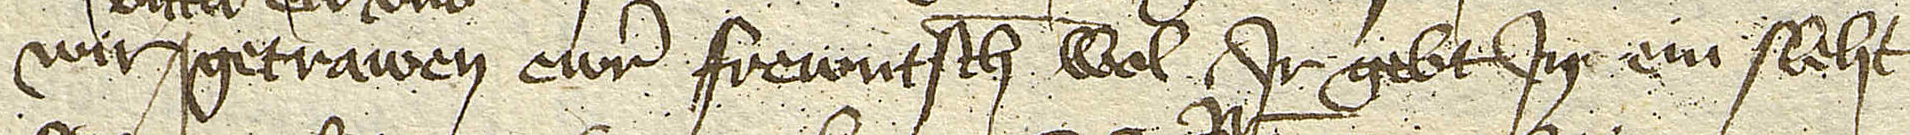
wir getrawen ewr* frewntſch* wol / Ir gebt In ein ſleht
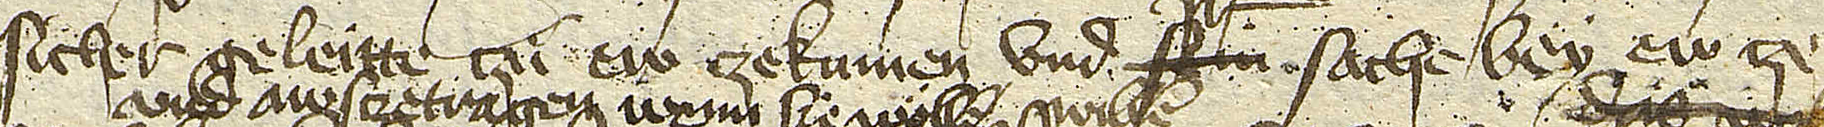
ſicher geleitte cʒü ew cʒekumen vnd ſein ſache bey ew cʒe
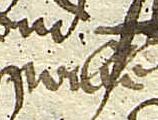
wille*
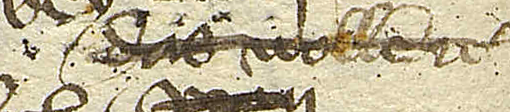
/ das wolle* ec*
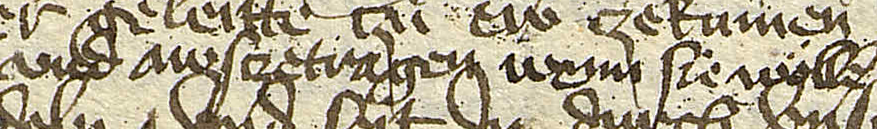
vnd awſcʒetragen wenn ſie wölle*
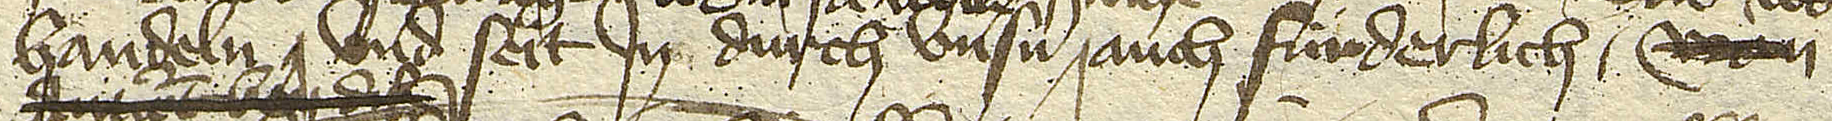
handeln vnd ſeit In durch vnſn* auch fürderlich / wan
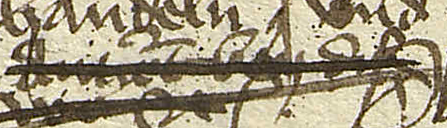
antwt* bey diſ
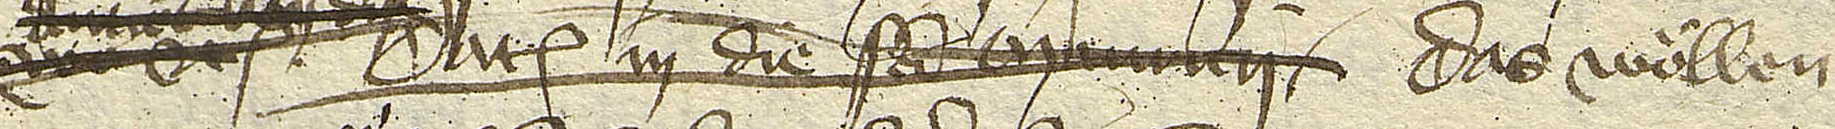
wir ec* /. Dat* in die ſci* Mauricii* / Das wöllen
